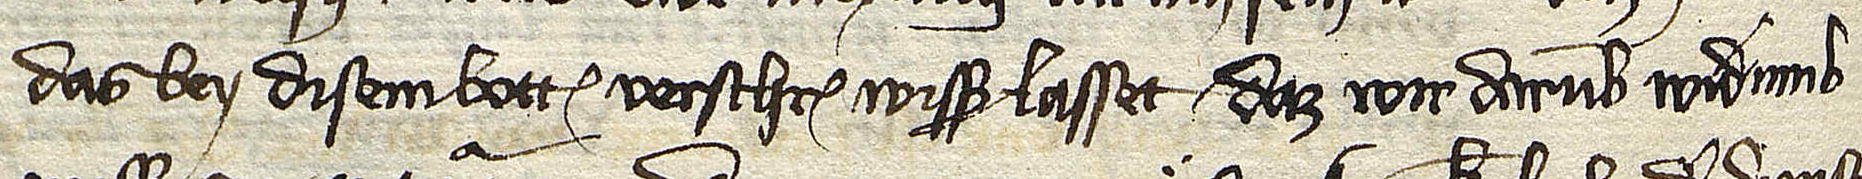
das bey diſem bott* verſchr* wiſſ* laſſet / daʒ wir darub* wid*umb
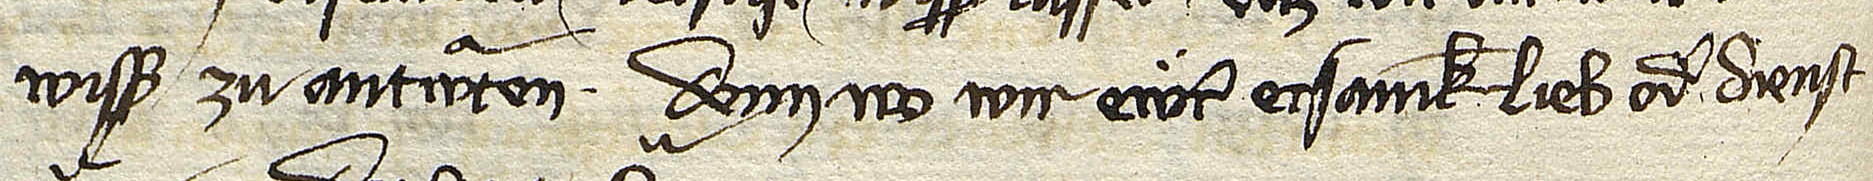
wiſſ* ʒu antw*ten . Denn wo wir eẅr* erſamk* lieb od* dienſt
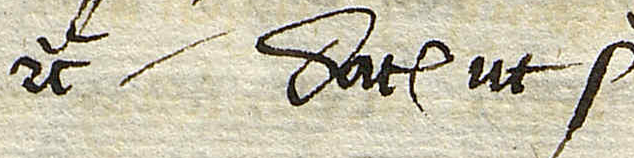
ec* / Dat* ut ſ*
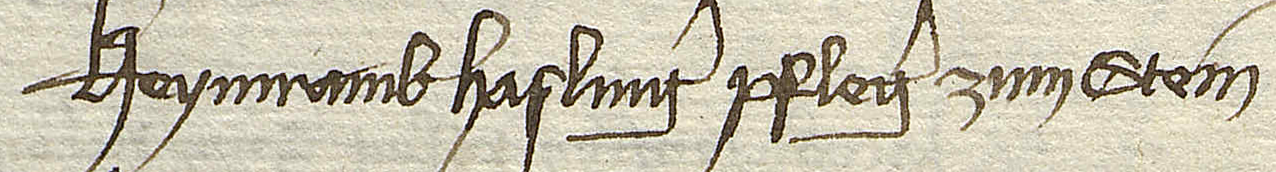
Heymramb haſling* pfleg* ʒum Stein
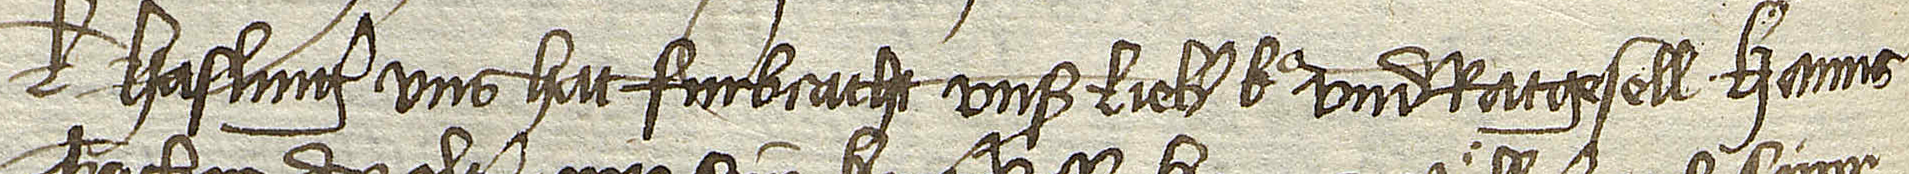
L* Haſling* vns hat furbracht vnſ* lieb* b* vnd Ratgeſell Hanns
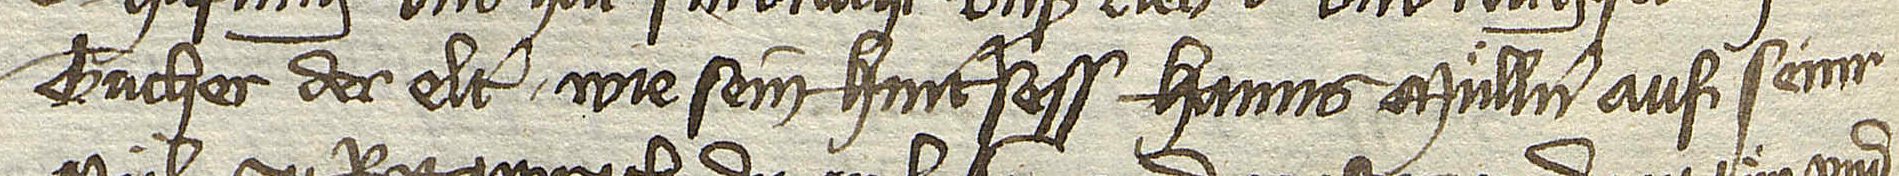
Tucher der elt* / wie ſein hint*ſeſſ hanns Mülln* auf ſeinr
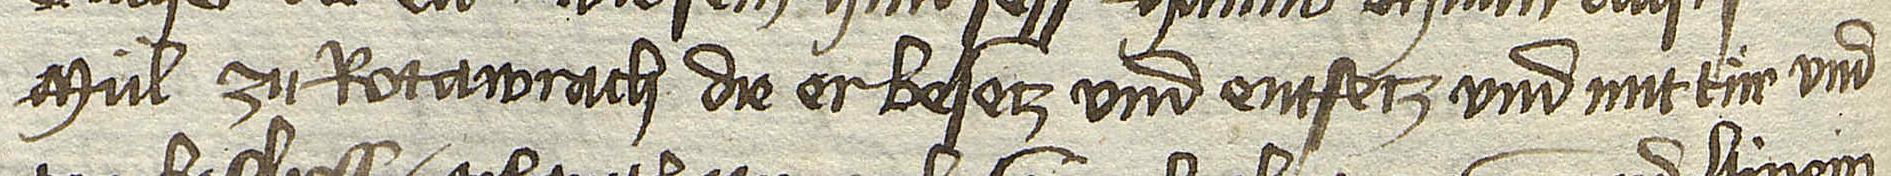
Mül ʒu Rotawrach die er beſecʒ vnd entſecʒ vnd mit tür vnd
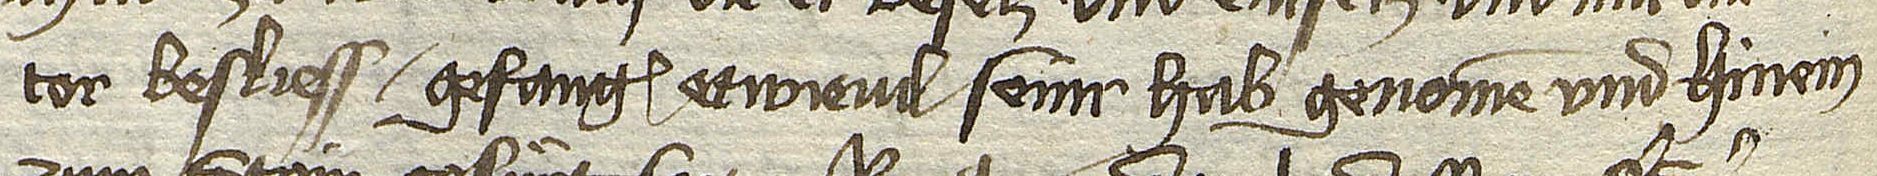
tor beſlieſſ / gefang* etwieuil ſeinr hab genome* vnd hinein
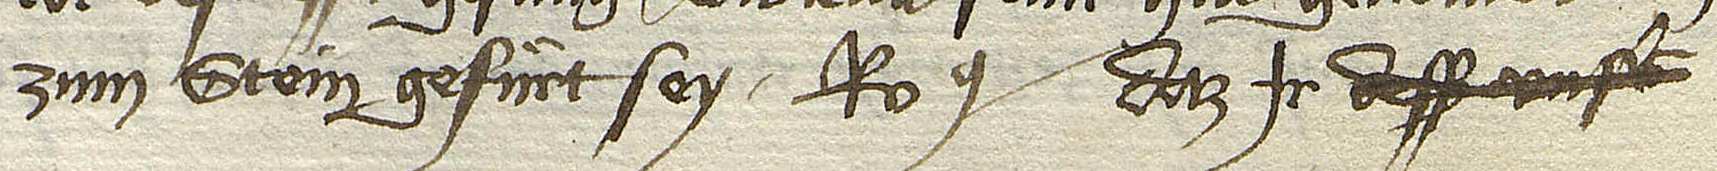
ʒum Stein gefürt ſey / Ro* / daʒ Ir deſſ* vnſ*s
